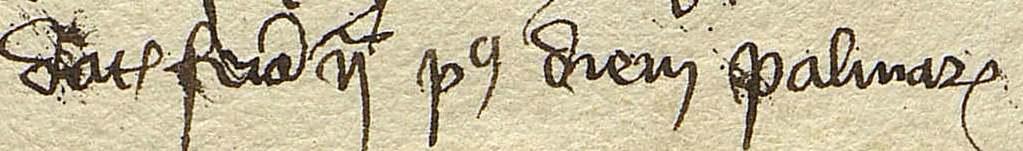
dat* feia* ii* p* diem Palma*
